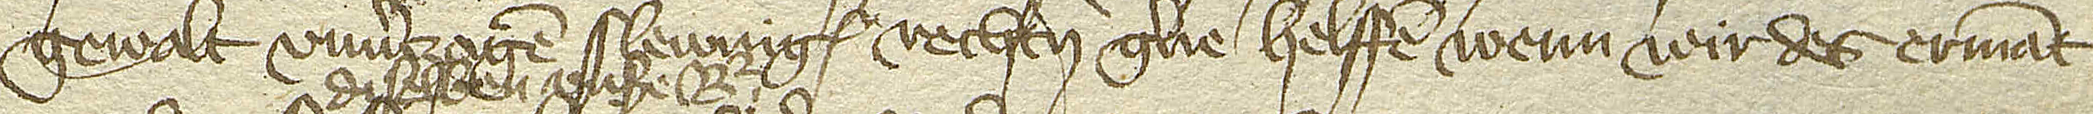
gewalt vnu*cʒoge* ſlewnig* rechtn* g*ne helffe* wenn wir des ermat*
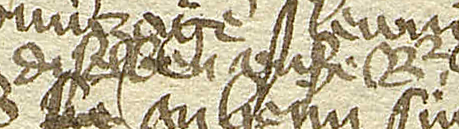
diſelben vnſ*e B*
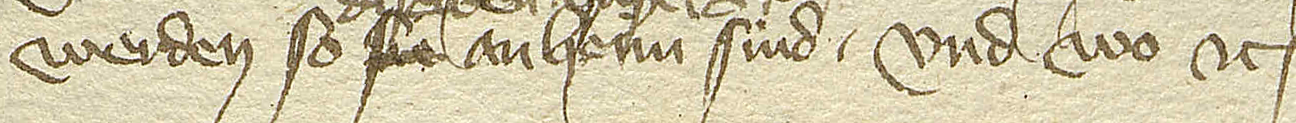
werden ſo ſie anheim ſind / vnd wo ec*
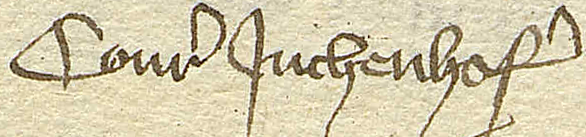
Conr* Iuchenhof*
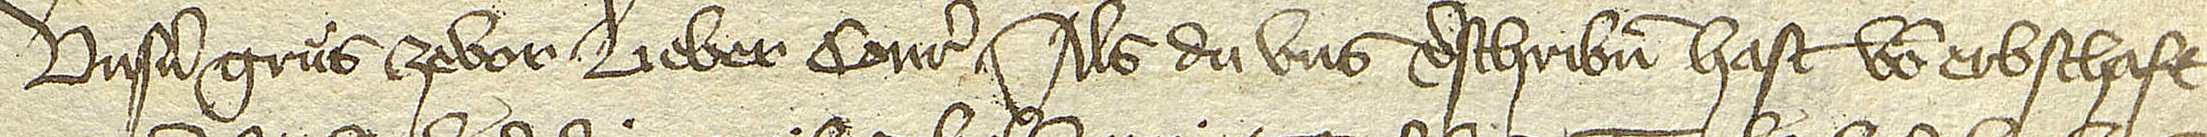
Vnſn* grüs cʒevor / Lieber Conr* / Als du vns v*ſchribn* haſt vo* erbſchaft
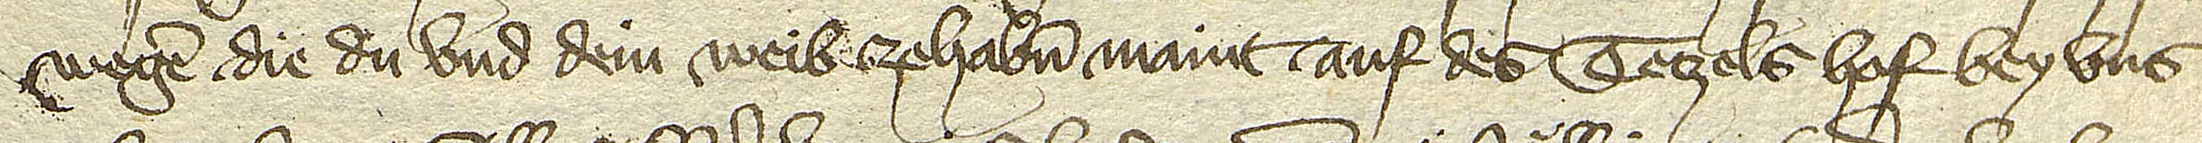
wege* / die du vnd dein weib cʒehabn* maint / auf des Tecʒels hof bey vns
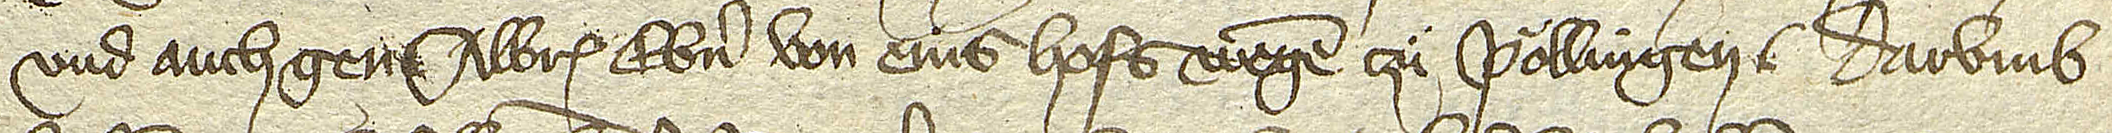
vnd auch gen Albr* Ebn* von eins hofs wege* cʒü Pollingen / darvmb
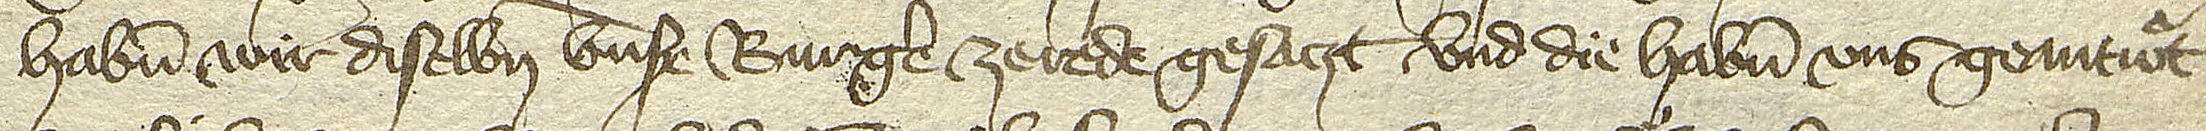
habn* wir diſelbn* vnſ*e Burg*e cʒerede geſacʒt / vnd die habn* vns geantwt*
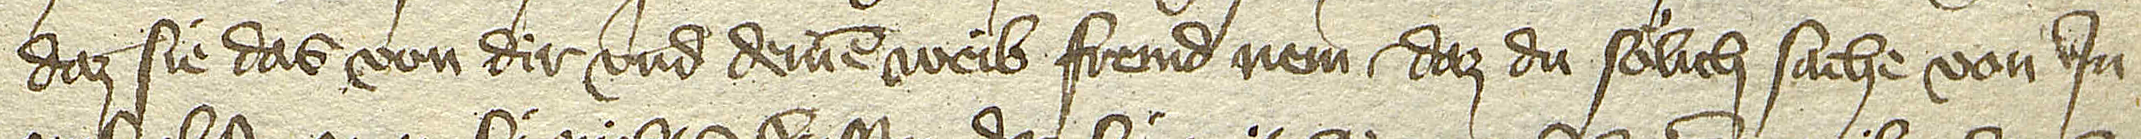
daʒ ſie das von dir vnd deine* weib fremd nem / daʒ du ſölich ſache von In
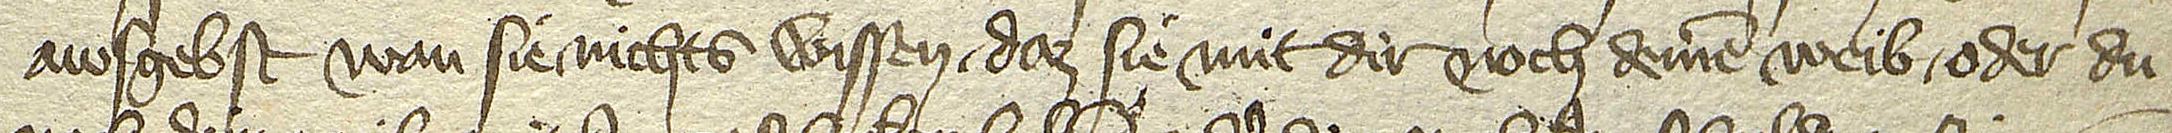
awfgebſt wan ſie nichts wiſſen / daʒ ſie mit dir noch deine* weib / oder du
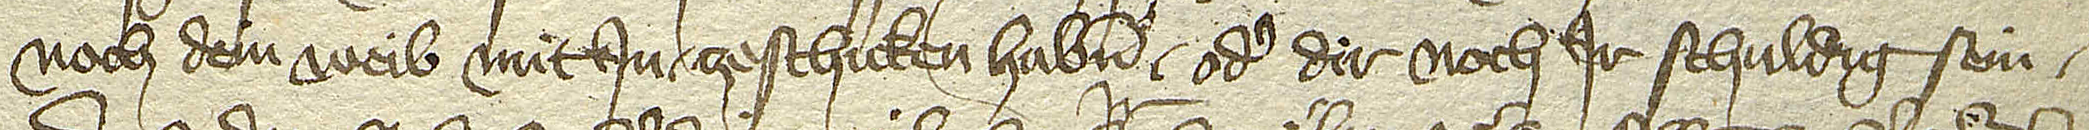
noch dein weib mit In / cʒeſchicken habn* / od* dir noch Ir ſchuldig ſein /
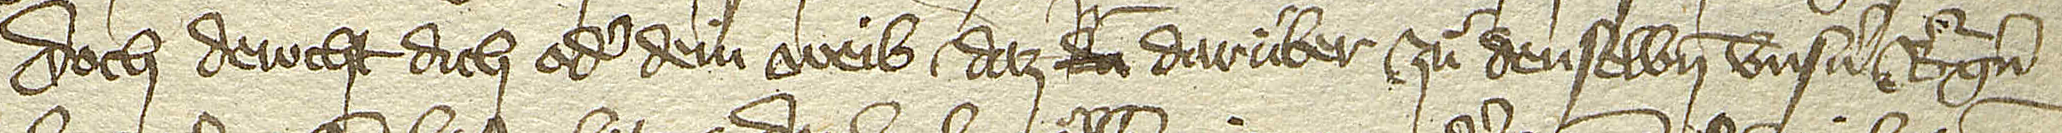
Doch dewcht dich od* dein weib / daʒ du darüber cʒü denſelbn* vnſn* B*gn*
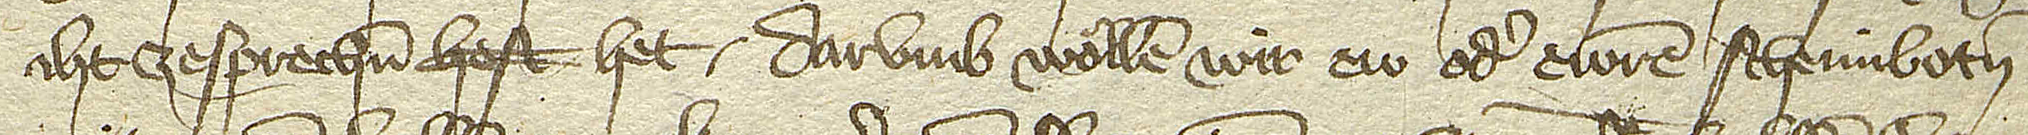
iht cʒeſprechn* heſt het / darvmb wölle* wir ew od* ewre* ſcheimbotn*
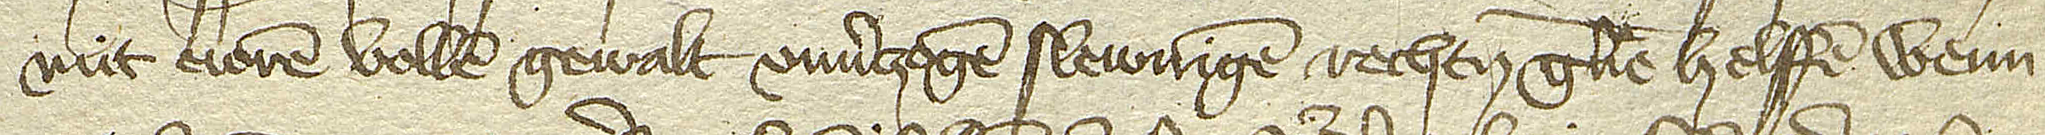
mit ewre* volle* gewalt vnu*cʒoge* ſlewnige* rechtn* g*ne helffe* wenn
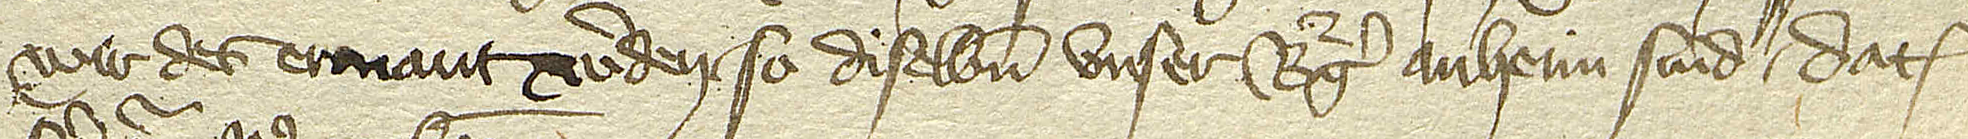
wir des ermant w*den / ſo diſelbn* vnſer B*g* anheim ſind / dat*
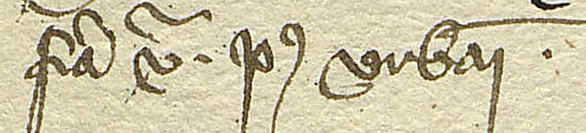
fia* v* . p* vrbai* .
